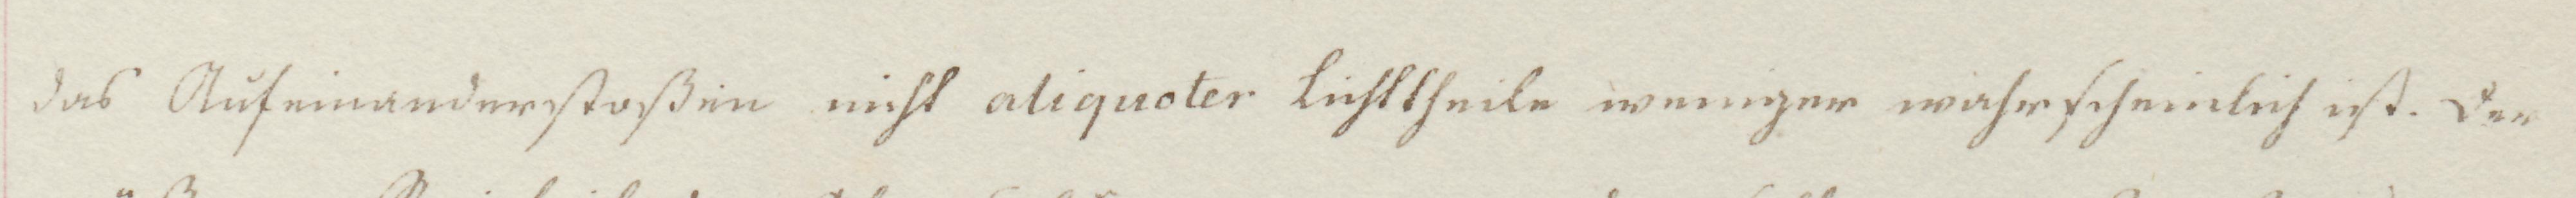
das Aufeinanderstoßen nicht aliquoter Lichttheile weniger wahrscheinlich ist. Der
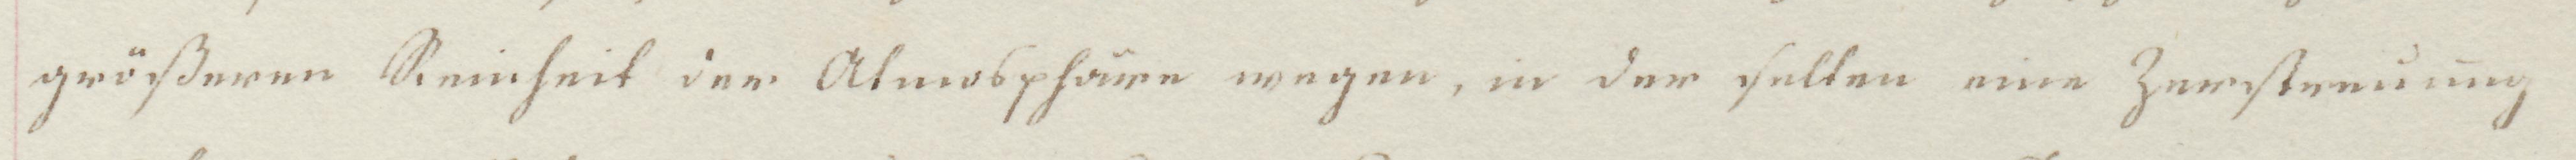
größeren Reinheit der Atmosphäre wegen, in der selten eine Zerstreuung
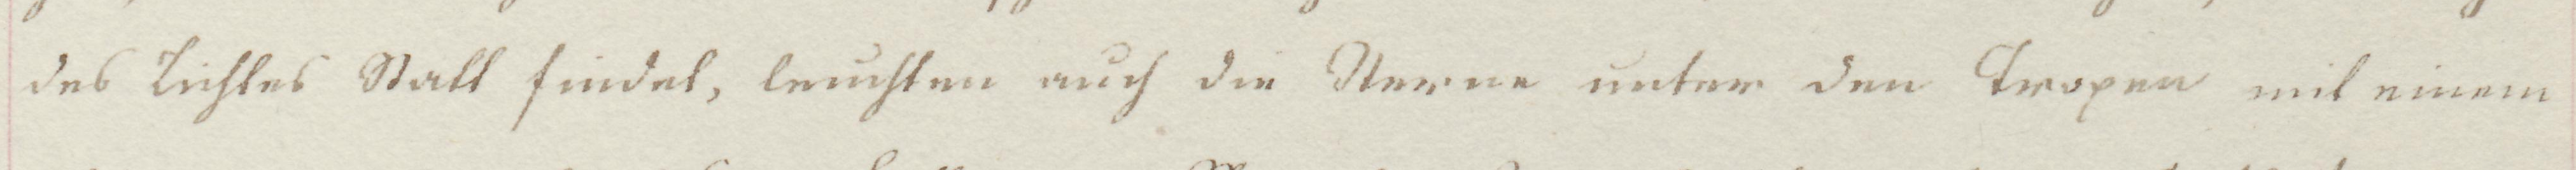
des Lichtes Statt findet, leuchten auch die Sterne unter den Tropen mit einem
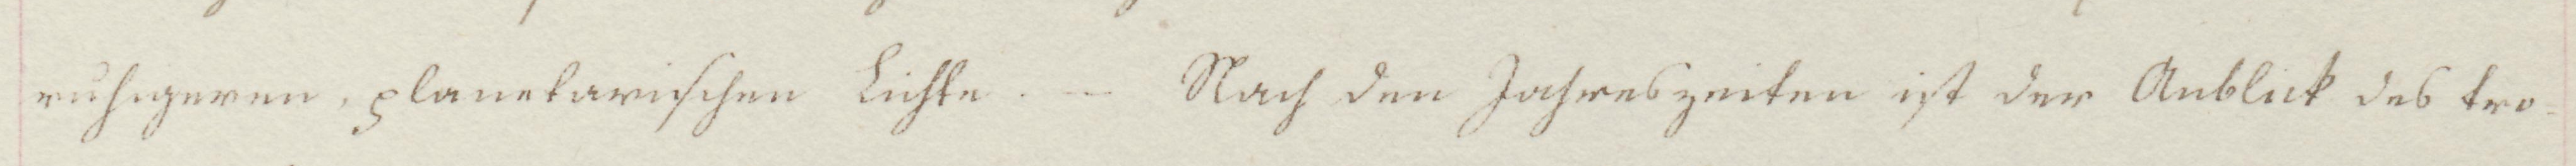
ruhigeren planetarischen Lichte. – Nach den Jahreszeiten ist der Anblick des tro-
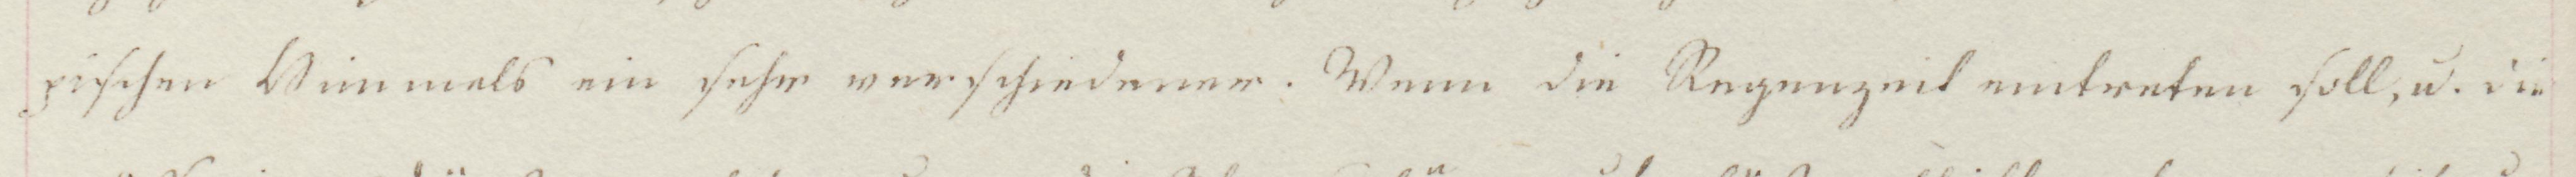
pischen Himmels ein sehr verschiedener. Wenn die Regenzeit eintreten soll, u. die
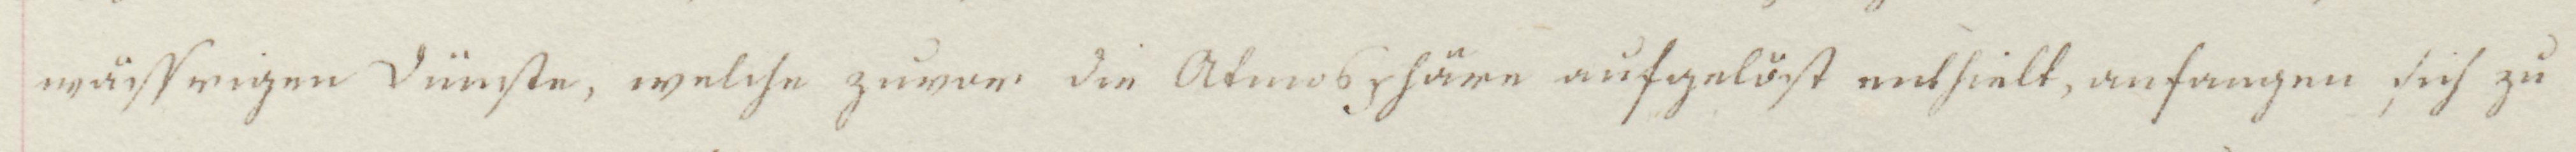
wässrigen Dünste, welche zuvor die Atmosphäre aufgelöst enthielt, anfangen sich zu
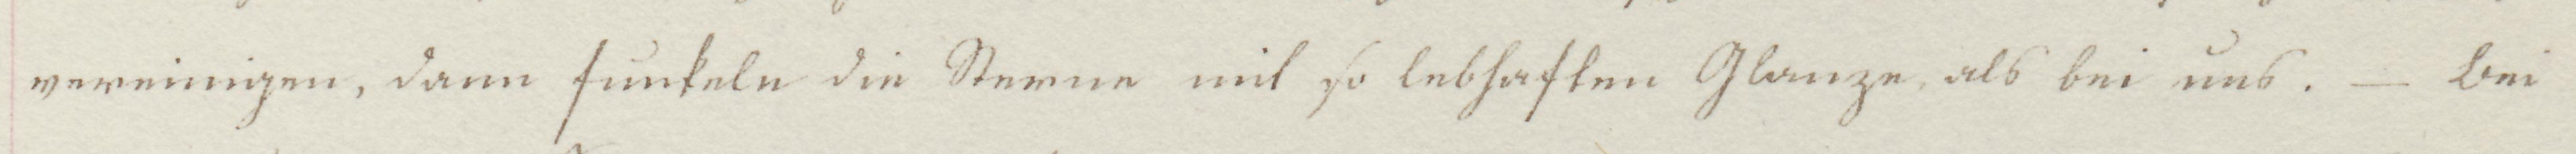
vereinigen, dann funkeln die Sterne mit so lebhaftem Glanze, als bei uns. – Bei
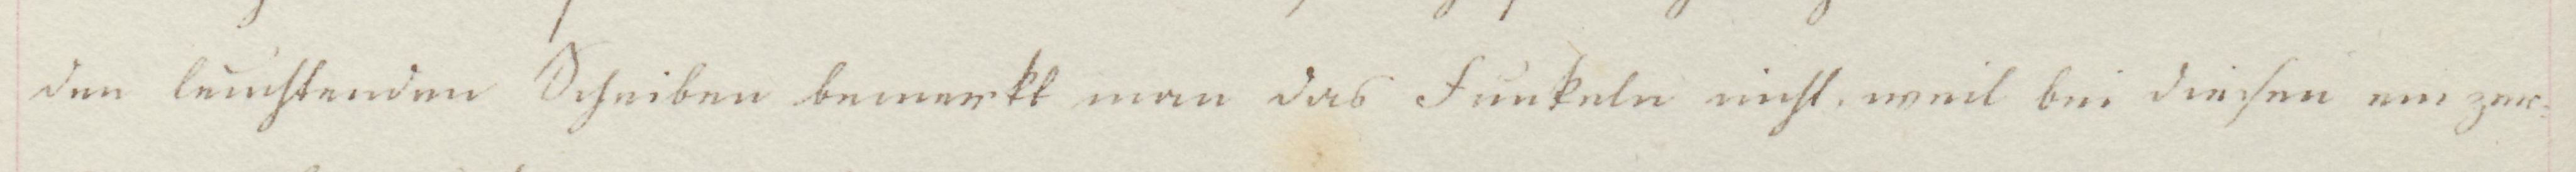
den leuchtenden Scheiben bemerkt man das Funkeln nicht, weil bei diesen ein zer-
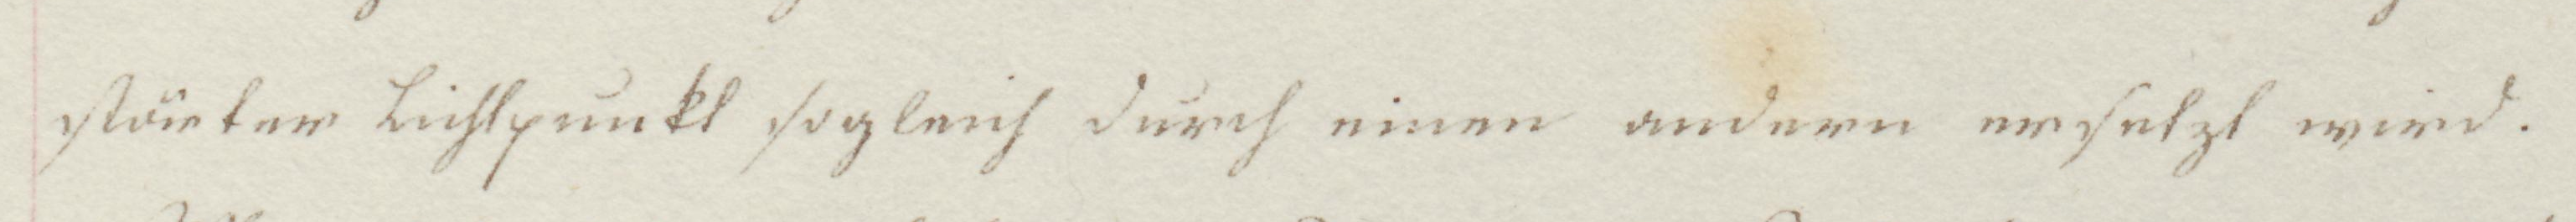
störter Lichtpunkt sogleich durch einen andern ersetzt wird.
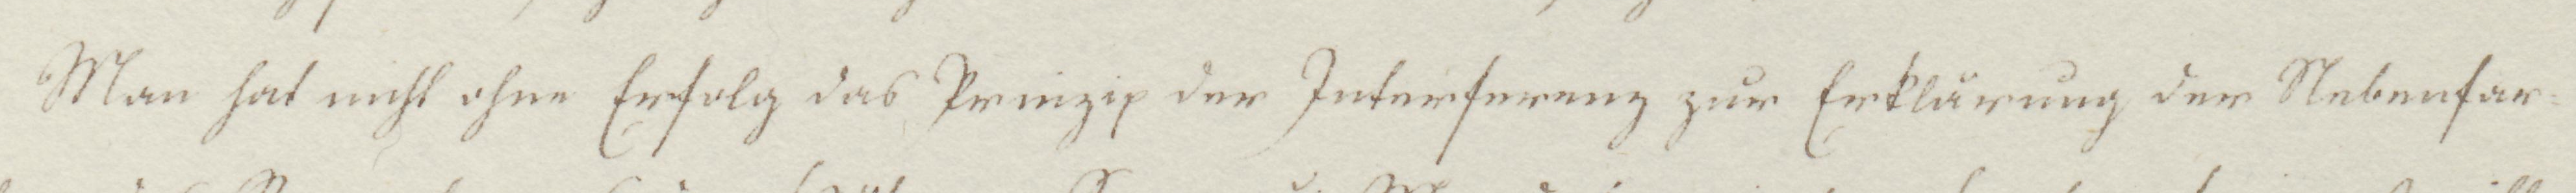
Man hat nicht ohne Erfolg das Prinzip der Interferenz zur Erklärung der Nebenfar-
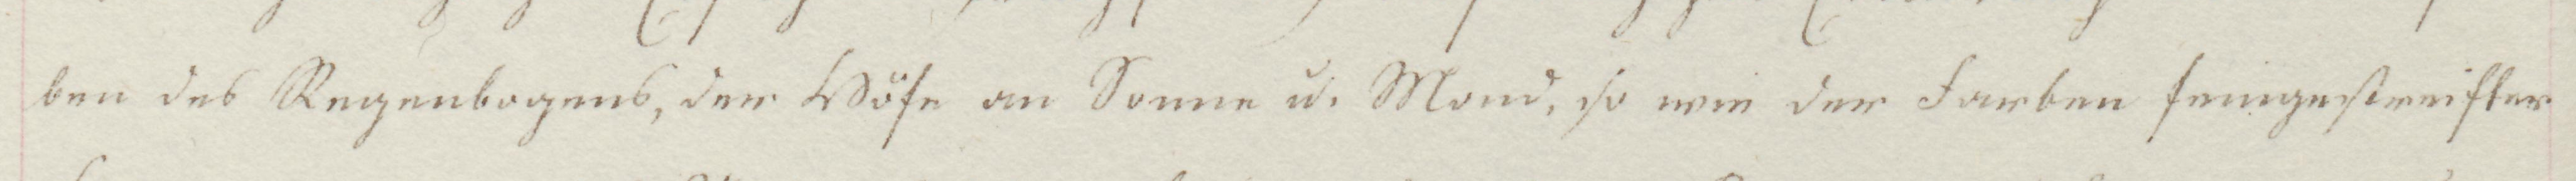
ben des Regenbogens, der Höfe an Sonne u. Mond, so wie der Farben feingestreifter
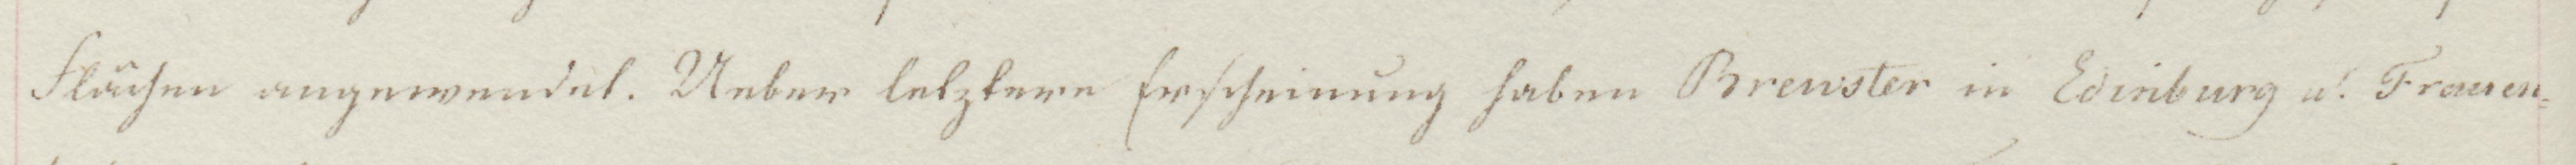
Flächen angewendet. Ueber letztere Erscheinung haben Brewster in Edinburg u. Frauen-
